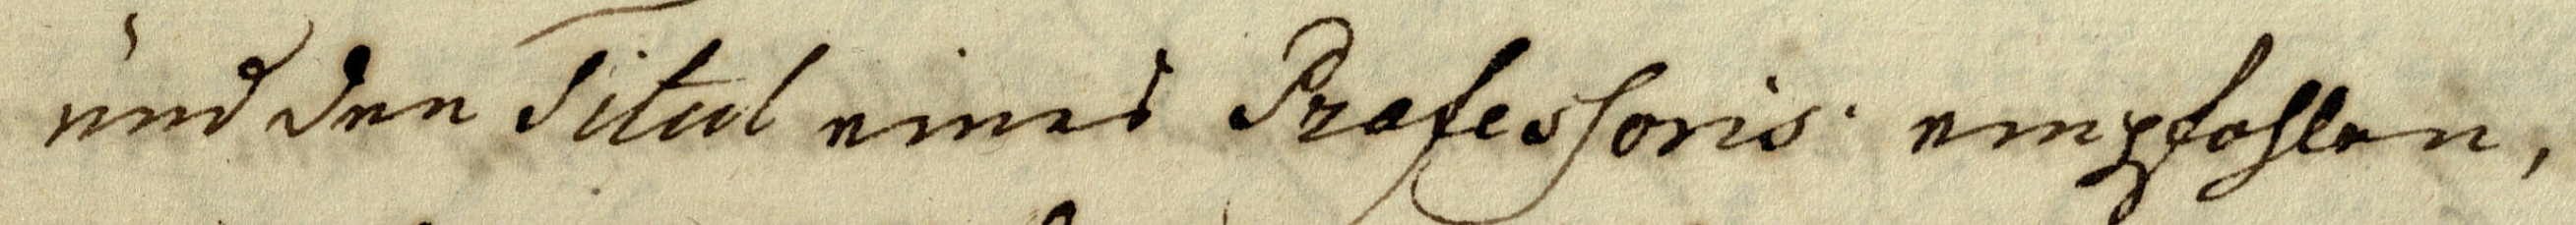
und den Titul eines Professoris empfohlen,
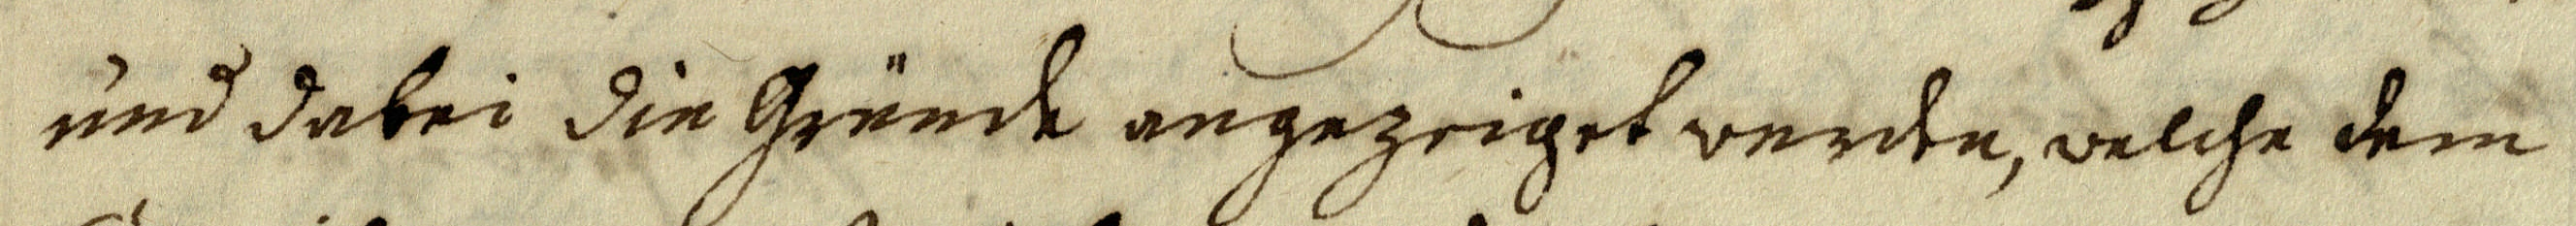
und dabei die Gründe angezeiget werden, welche dem
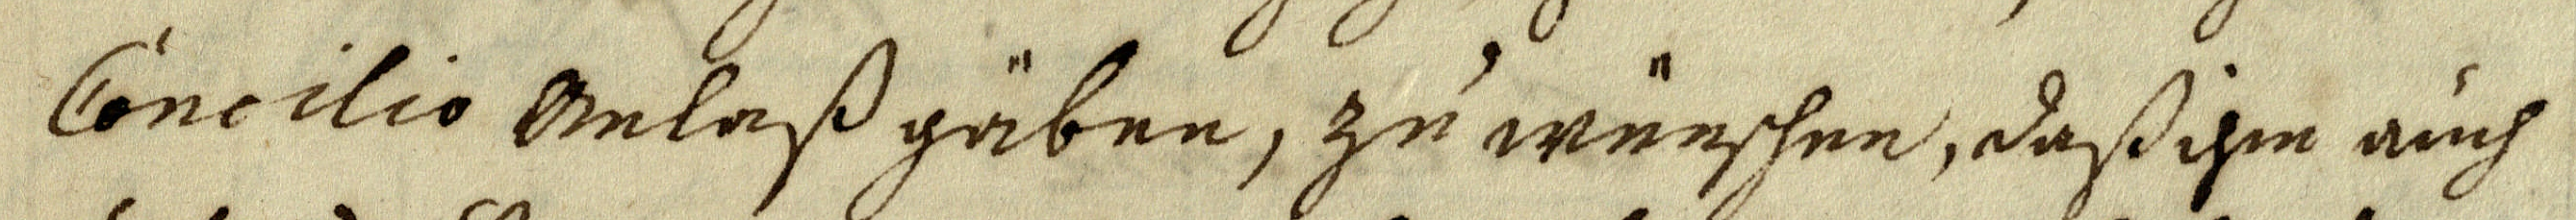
Concilio Anlaß gäben,zu wünschen, daß ihm auch
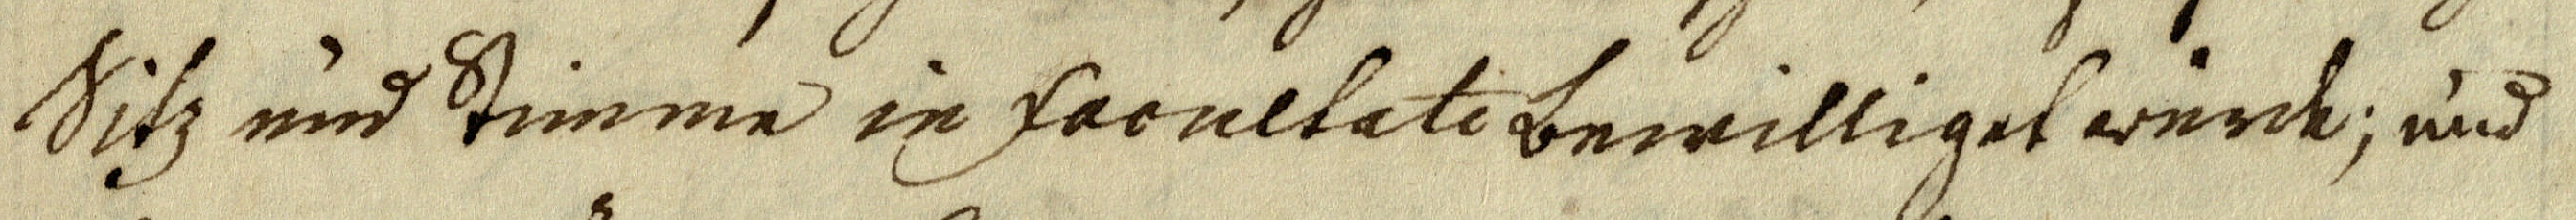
Sitz und Stimme in Facultate bewilliget würde, und
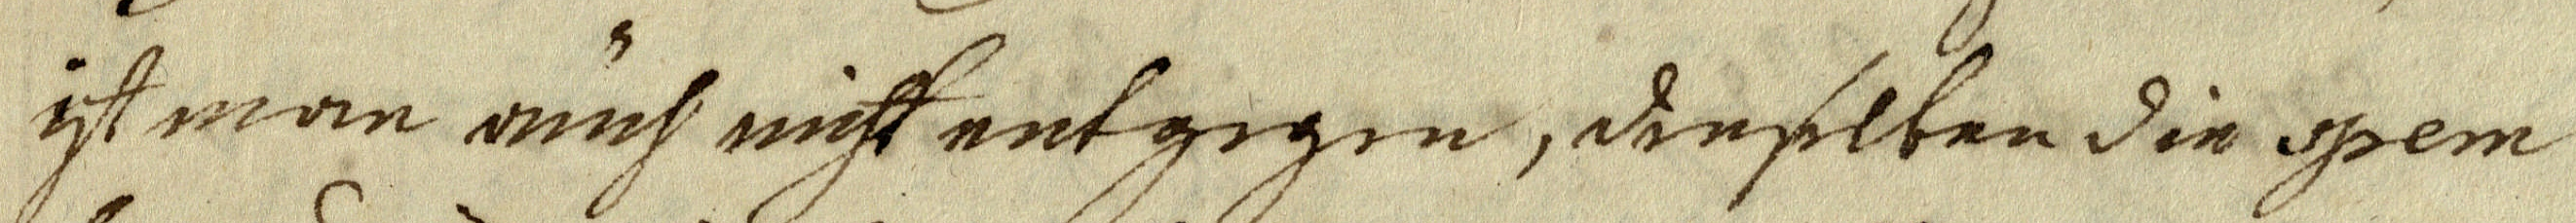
ist man auch nicht entgegen, denselben in spem
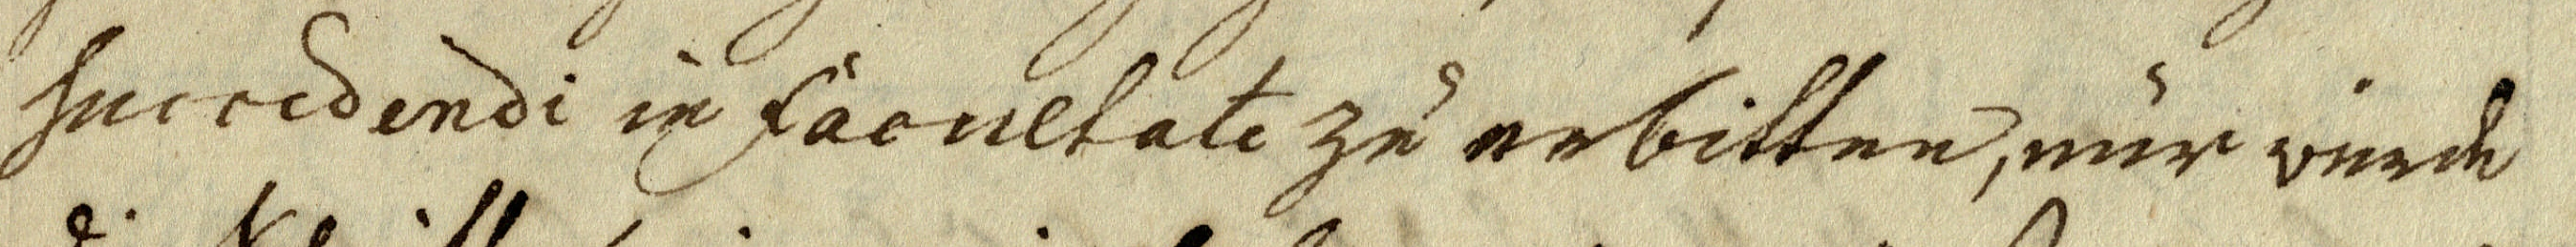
succedendi in Facultate zu erbitten, nur würde
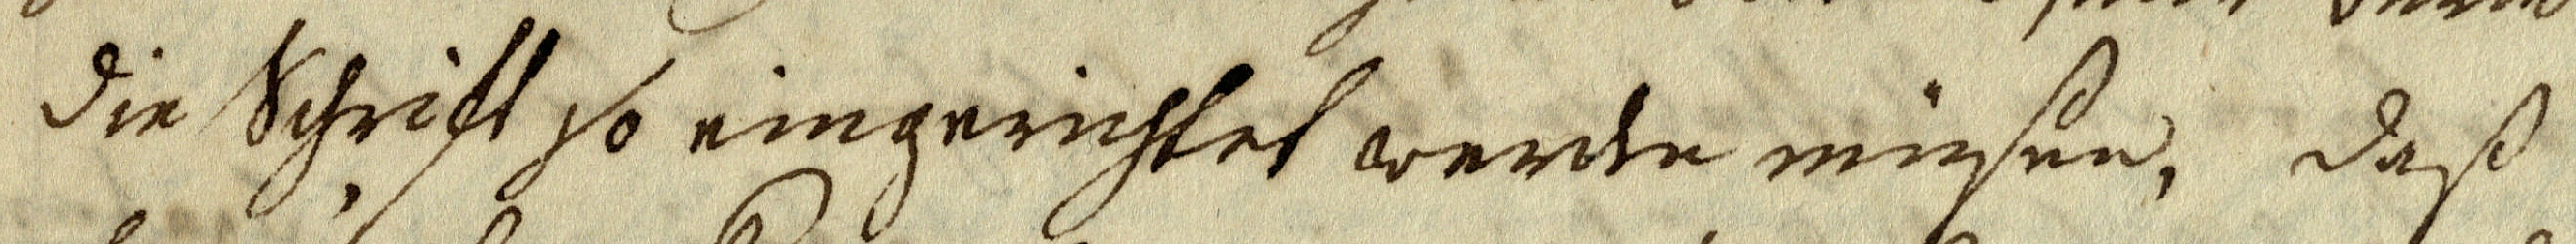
die Schrift so eingerichtet werden müßen, daß
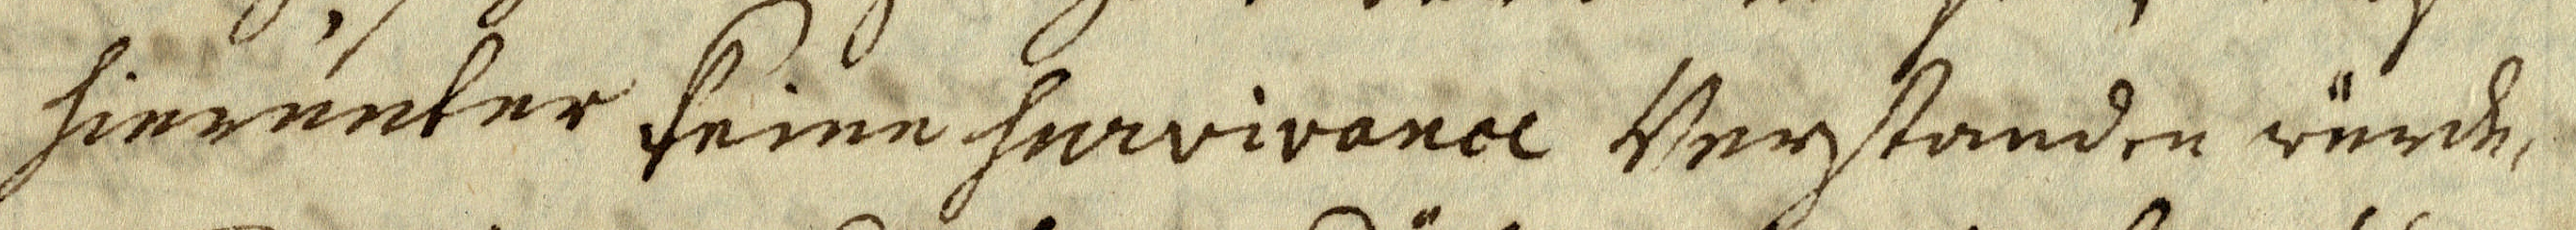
hierunter keine survivance verstanden würde,
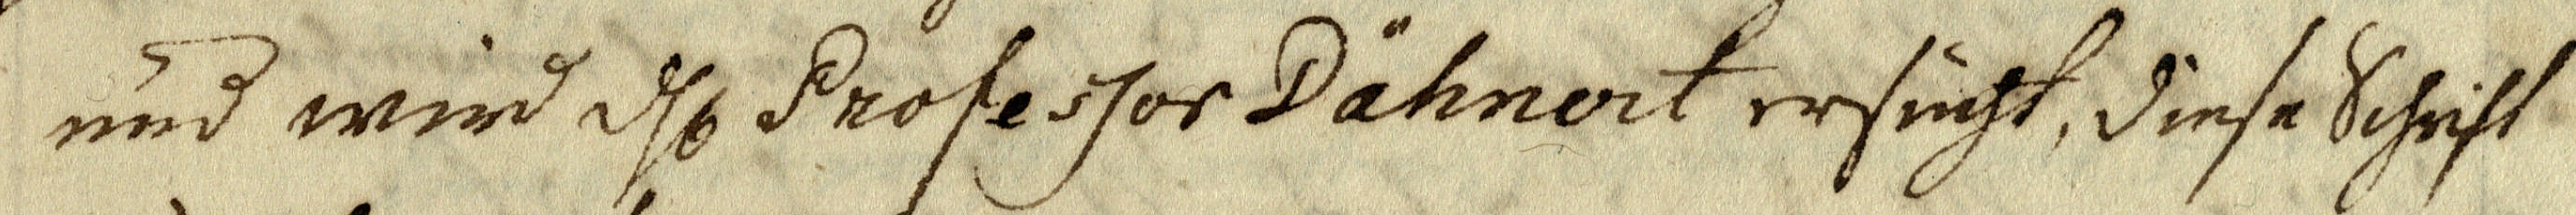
und wird dh Professor Dähnert ersucht, diese Schrift
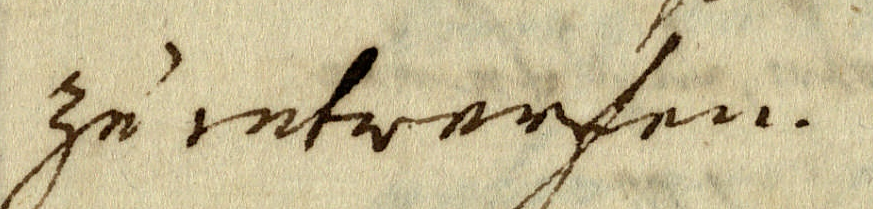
zu entwerfen.
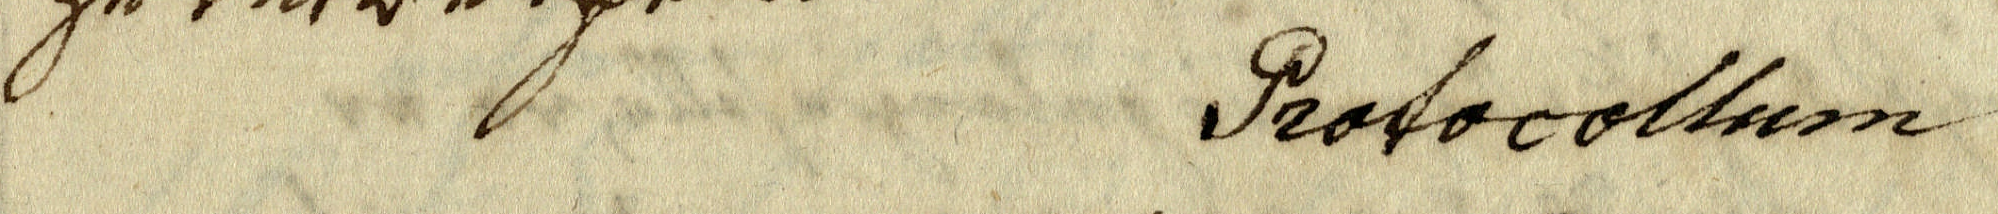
Protocollum
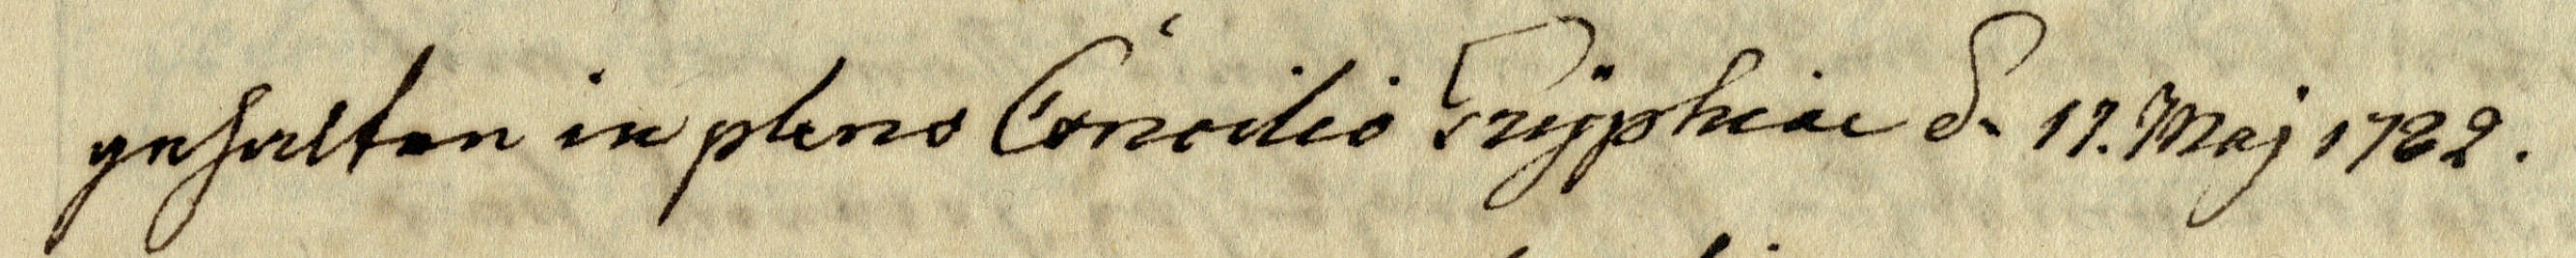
gehalten in pleno Concilio Grÿphiae d. 17. Maj 1782.
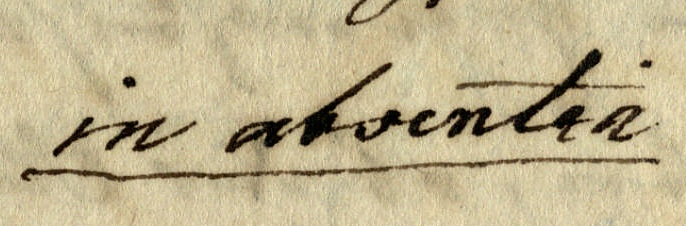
in absentia
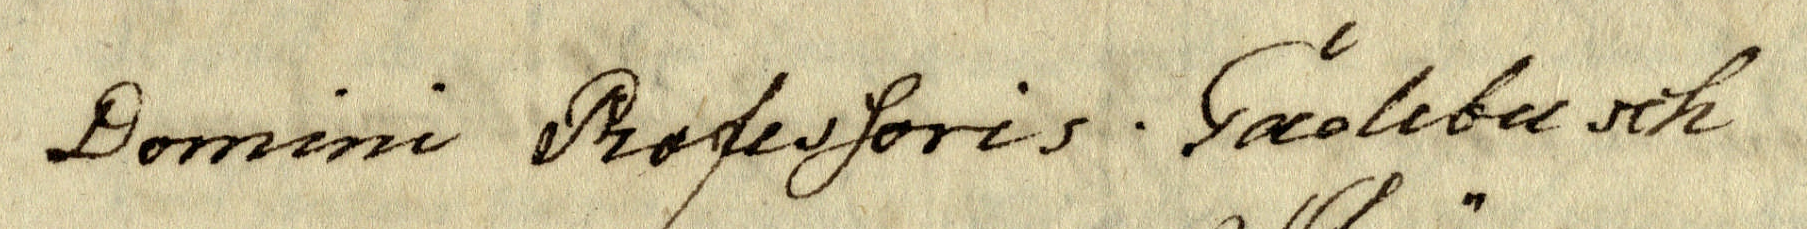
Domini Professoris Gadebusch
